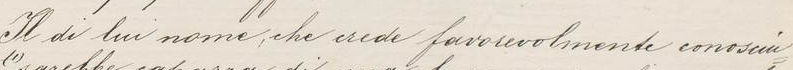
Il di lui nome, che crede favorevolmente conoscui-
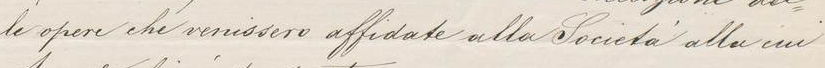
le opere che venissero affidate alla Società alla cui
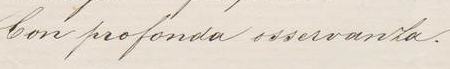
Con profonda osservanza.
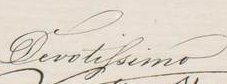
Devotissimo
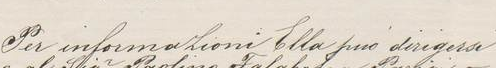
Per informazioni Ella può dirigersi
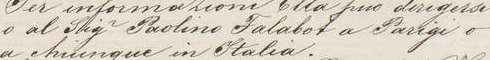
o al SigrePaolino Talabot a Parigi o
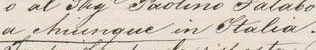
a chiunque in Italia.
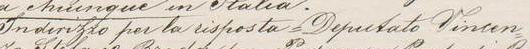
Indirizzo per la risposta: Deputato Vincen-
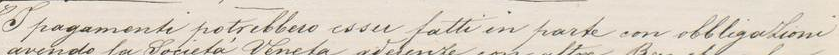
S pagamenti potrebbero esser fatti in parte con obbligazioni
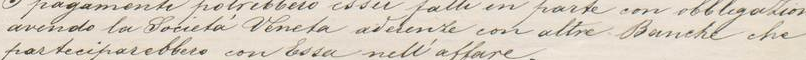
avendo la Società Veneta aderenze con altre Banche che
